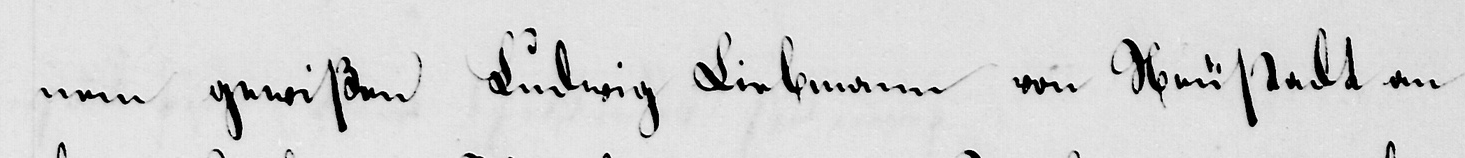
nem gewißen Ludwig Liebmann von Neustadt an
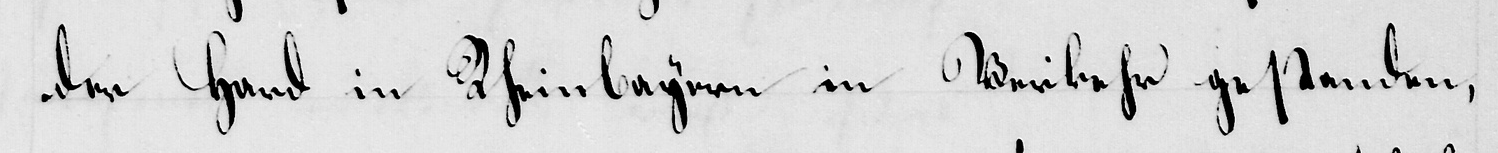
der Hard in Rheinbayern in Verkehr gestanden,
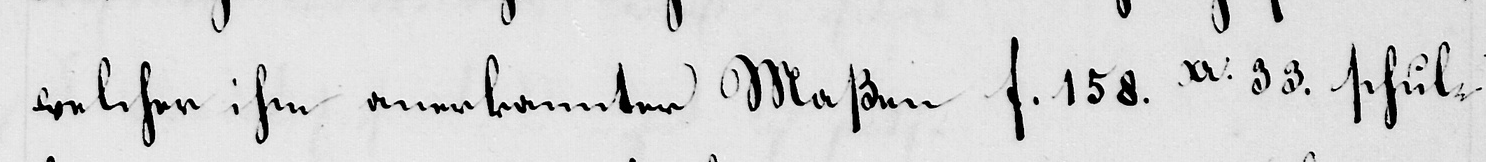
welcher ihm anerkannter Maßen f. 158. x. 33.schul¬
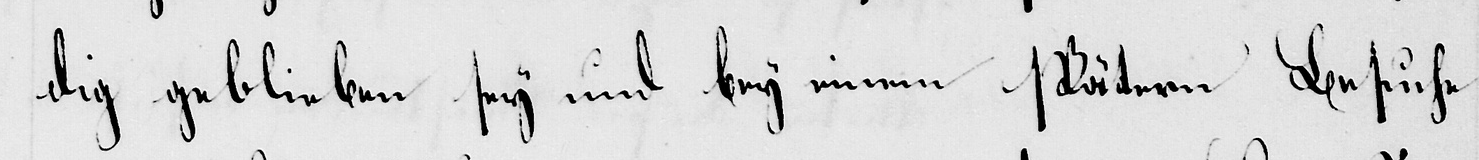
dig geblieben sey und bey einem spätern Besuche
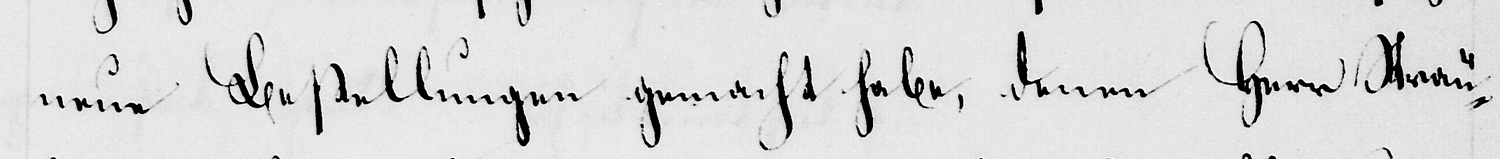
neue Bestellungen gemacht habe, denen Her Sträu¬
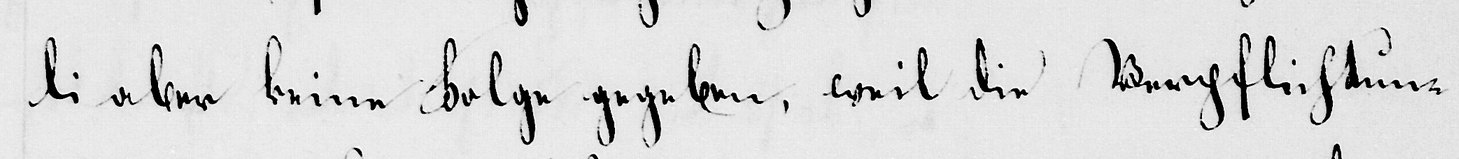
li aber keine Folge gegeben, weil die Verpflichtun¬
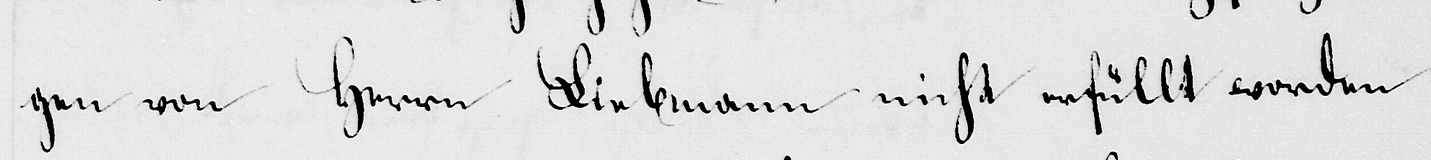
gen von Herrn Liebmann nicht erfüllt worden
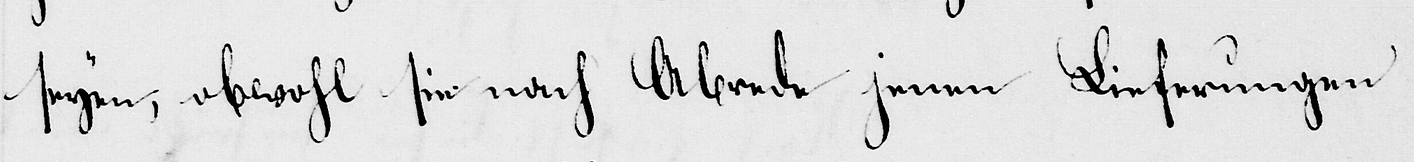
seyen, obwohl sie nach Abrede jenen Lieferungen
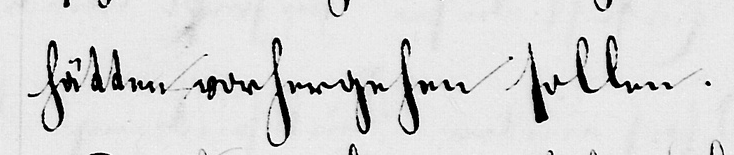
hätten vorhergehen sollen.
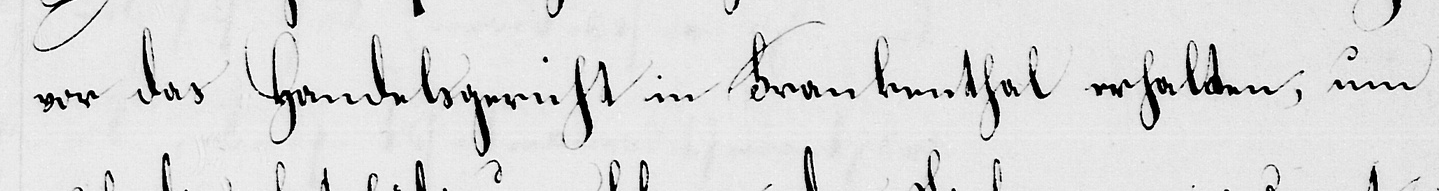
vor das Handelsgericht in Frankenthal erhalten, um
